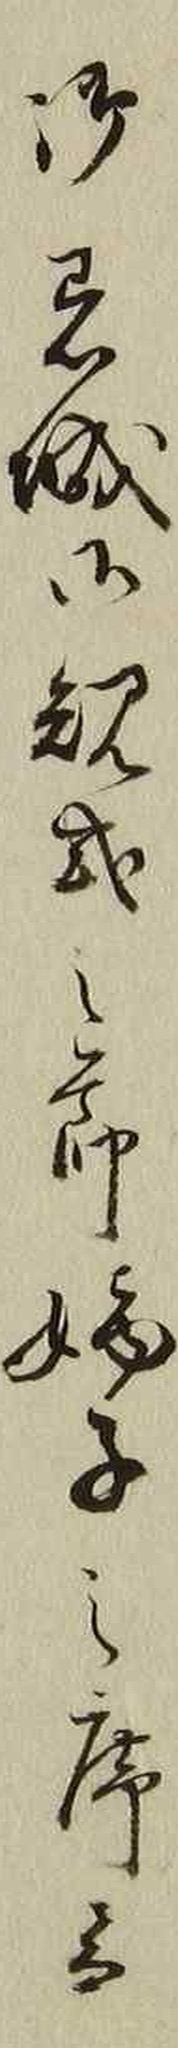御着城御規式之節嫡子之席ニ而
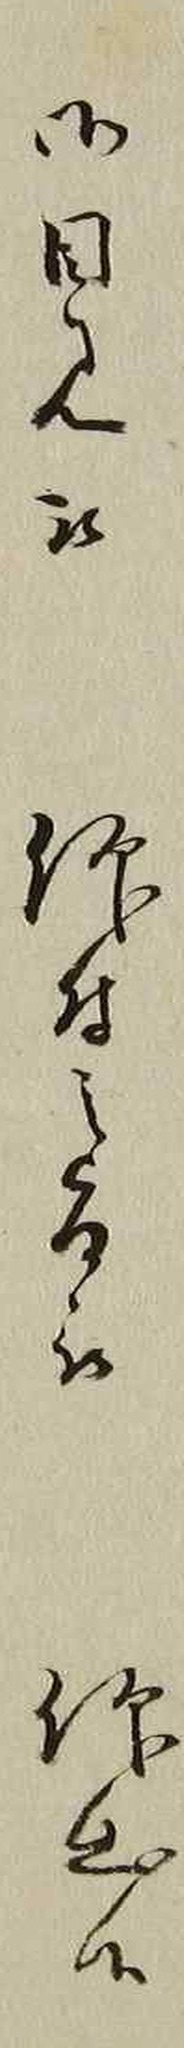御目見被仰付之旨被仰出候
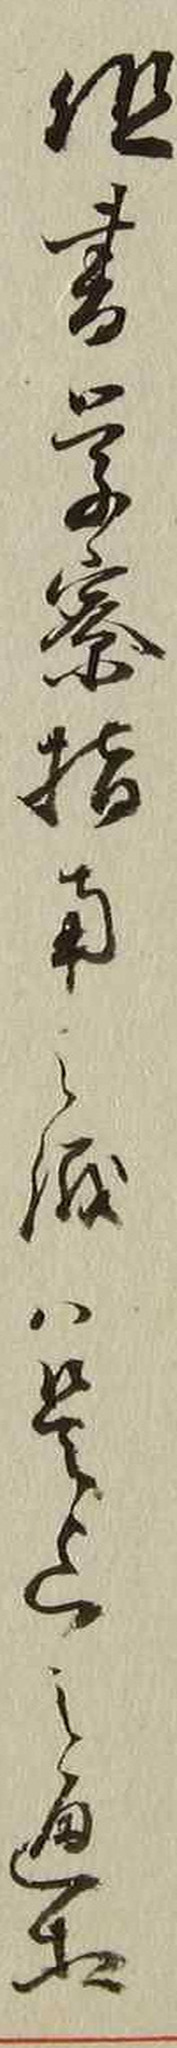但書学寮指南之儀ハ是迄之通相
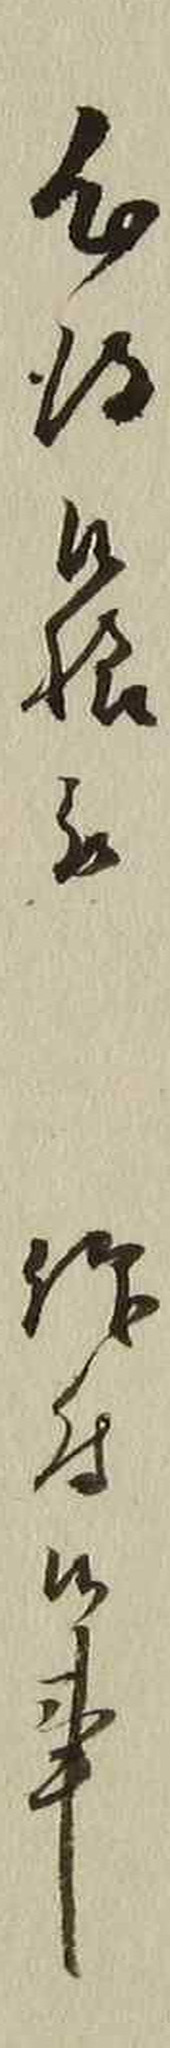心得候様被仰付候事
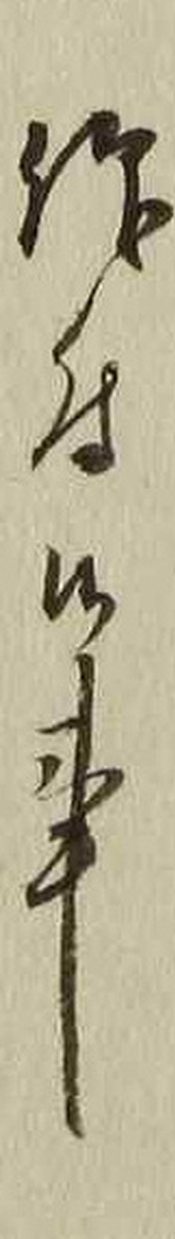仰付候事
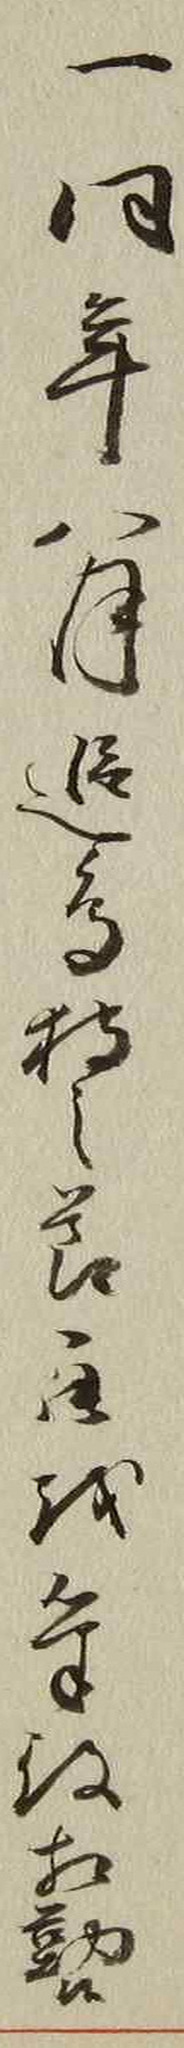一同年八月追鳥狩之節罷越筆役相勤候
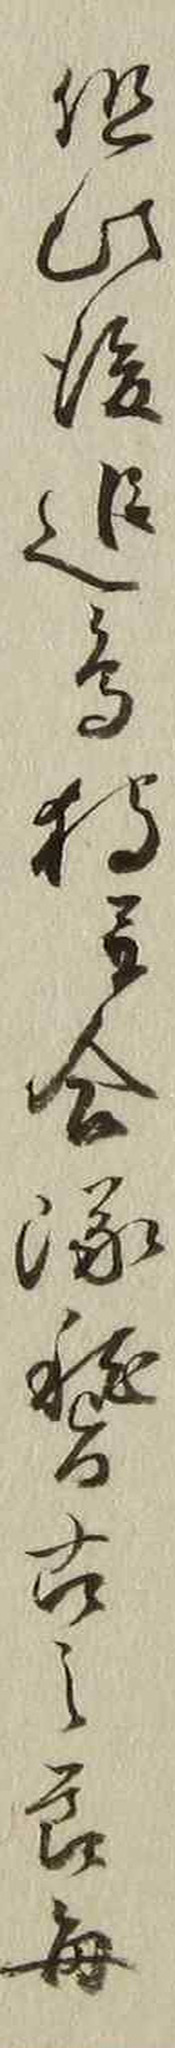但此後追鳥狩并合隊稽古之節毎
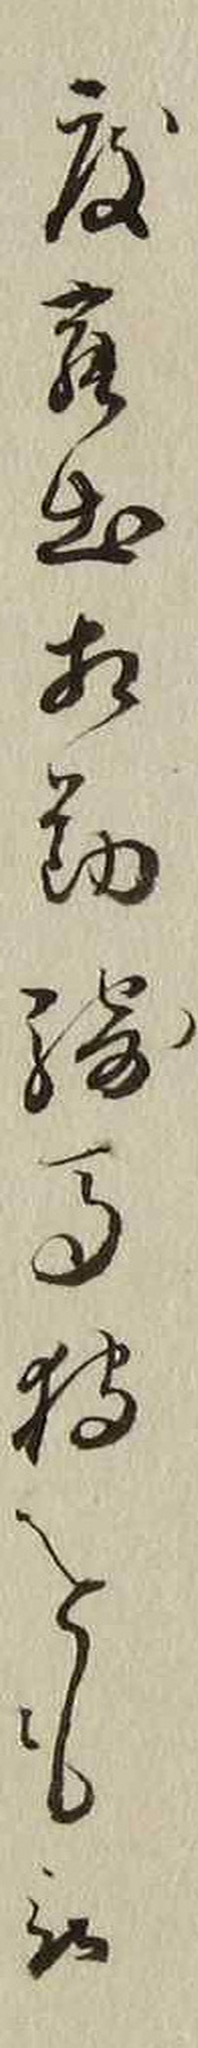度罷出相勤騎馬狩とも被
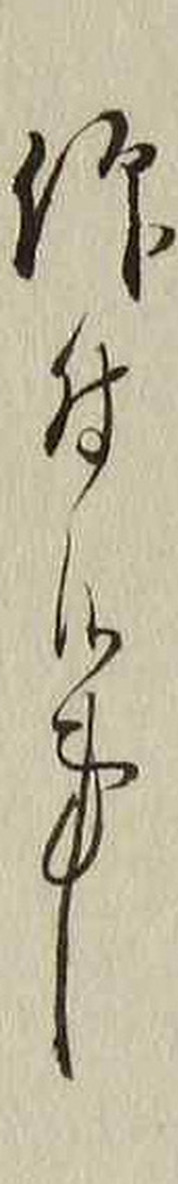仰付候事
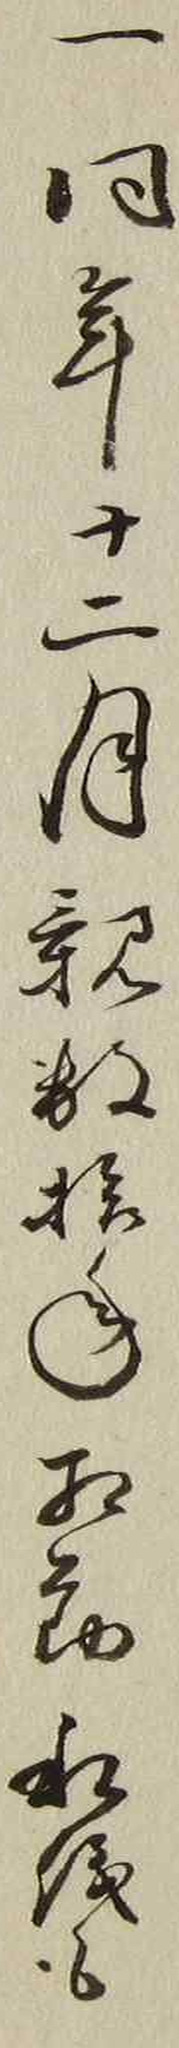一同年十二月親数拾年相勤私儀も
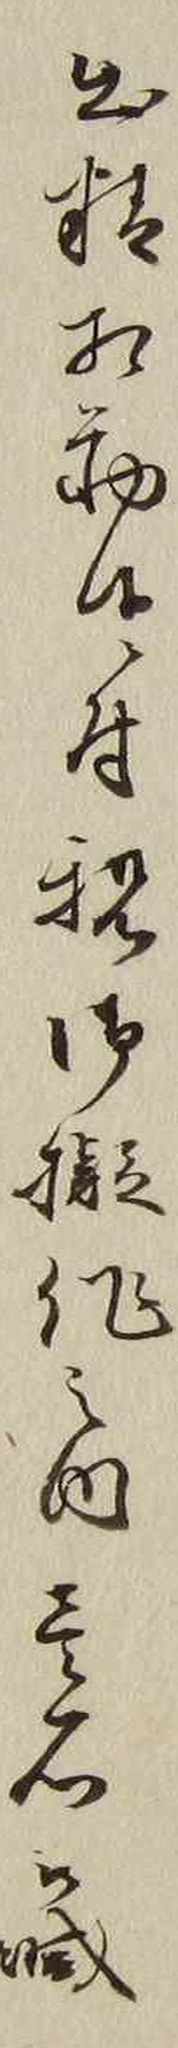出精相勤候ニ付親御擬作之内壱石被減
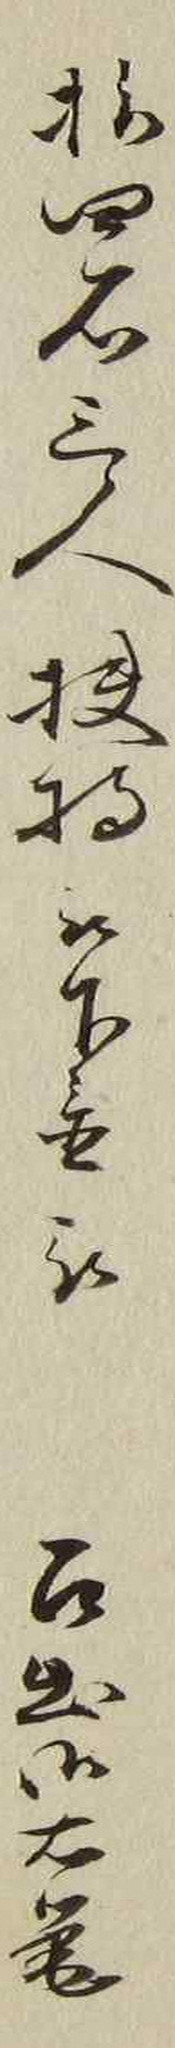拾四石三人扶持被下置被召出御右筆

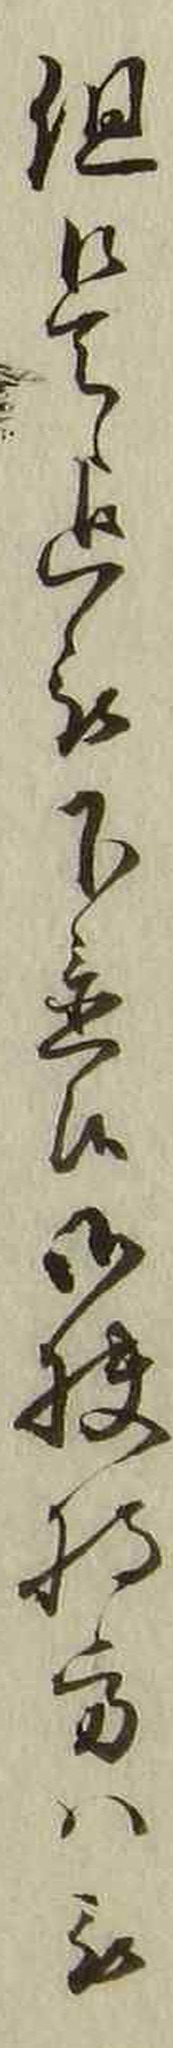但是迄被下置候御扶持方ハ被
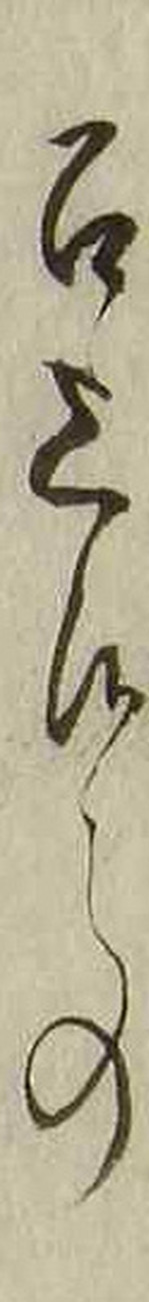召上候事
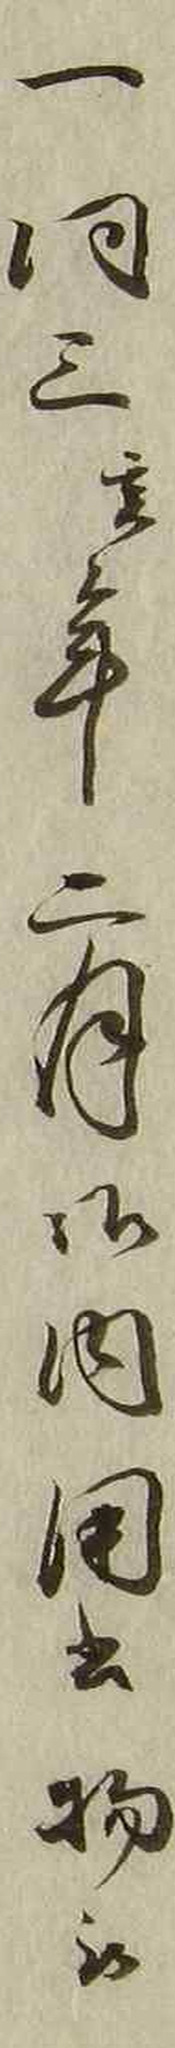一同年亥年二月御内用書物被
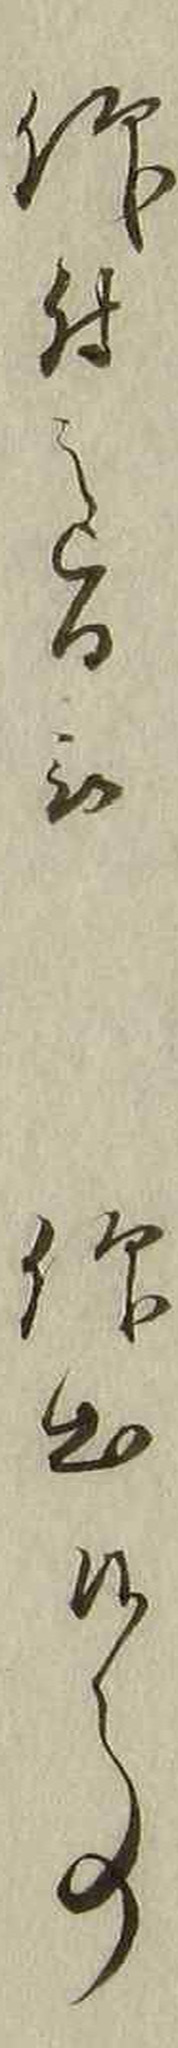仰付之旨被仰出候事
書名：諸士系譜　巻之4　い之部4
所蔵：会津若松市立会津図書館
